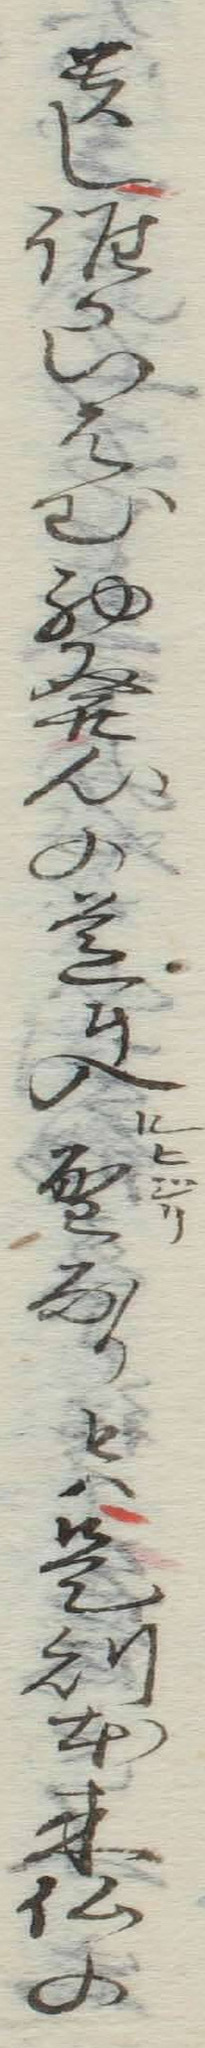貴し、誰かいはむ初発心の道に入聖なりとは、是則本来仏の
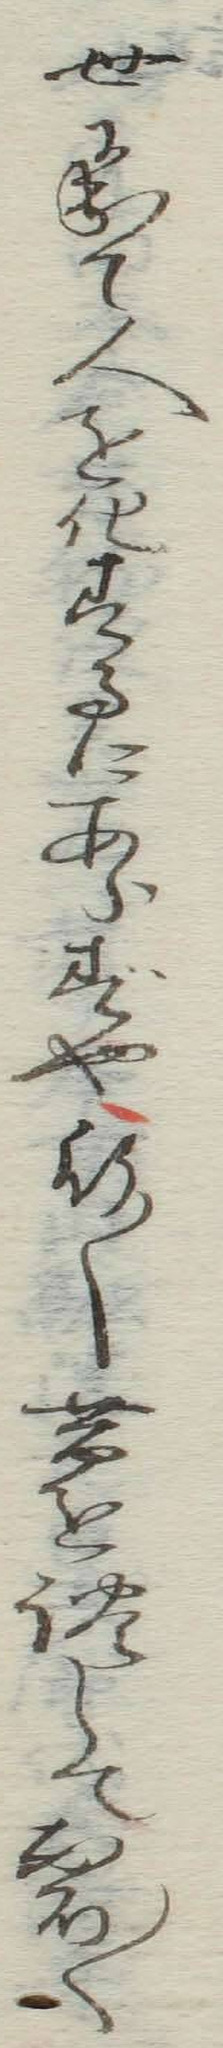世に出て人を化するにあらずや行〳〵昔を談してなほ〳〵
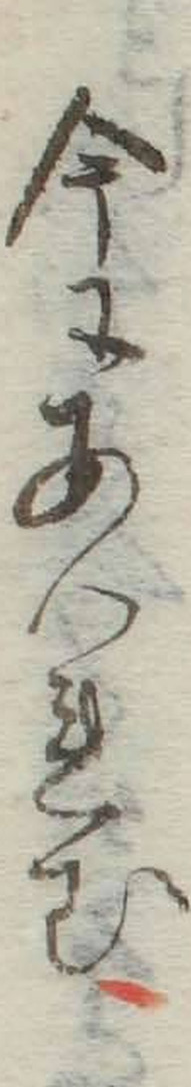今にあはれむ、

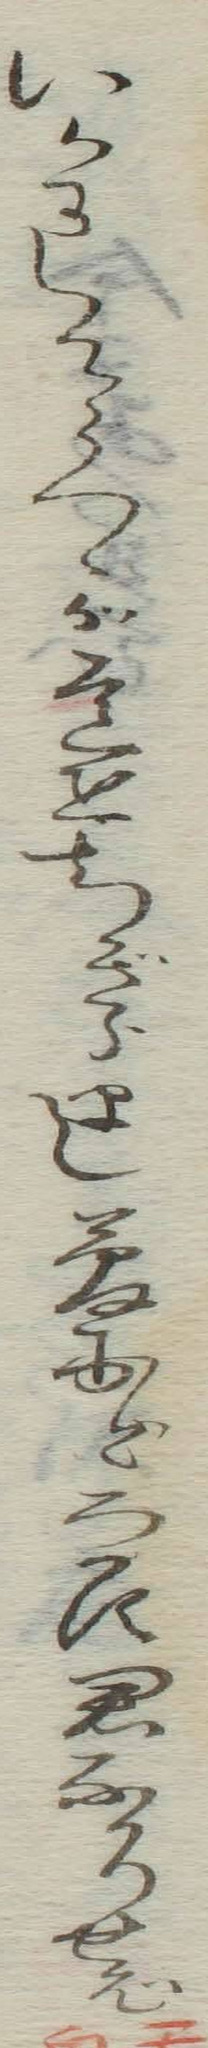いかにしてうつゝが道をちぎらまし夢おどろかす君なかりせばモ白
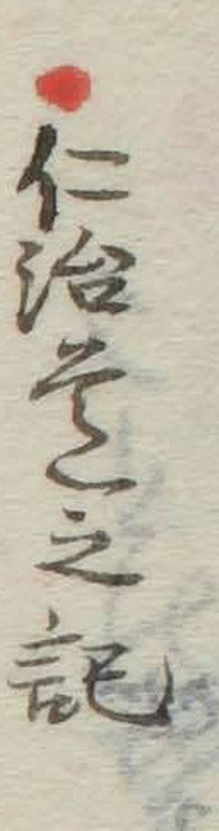●仁治道之記
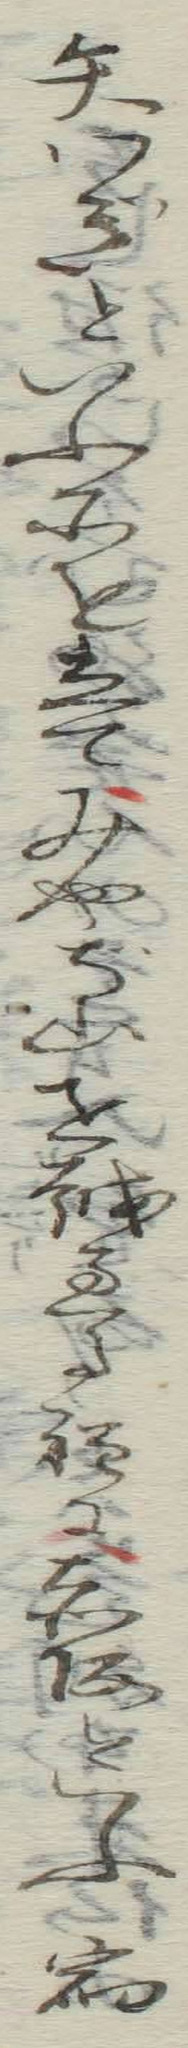矢はぎといふ所を立て、みやぢ山を越過る程に、赤坂といふ宿
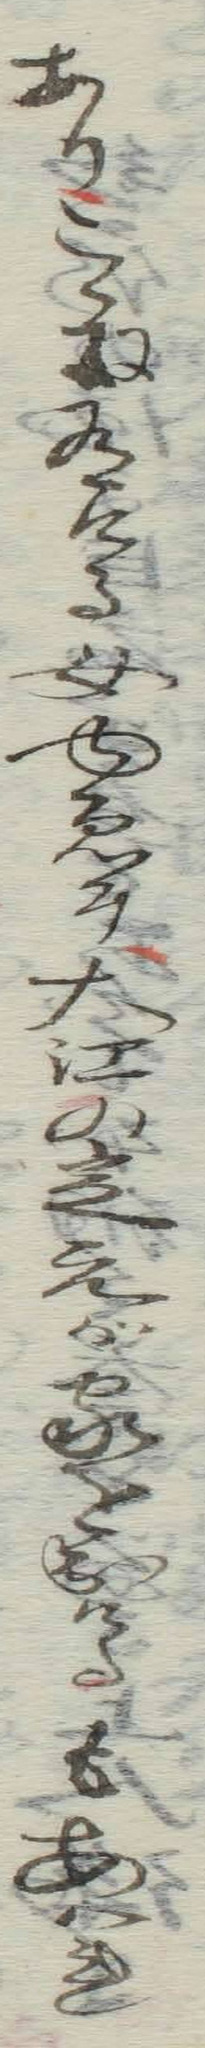あり、ここに有ける女ゆゑに、大江の定元が家を出けるもあはれ
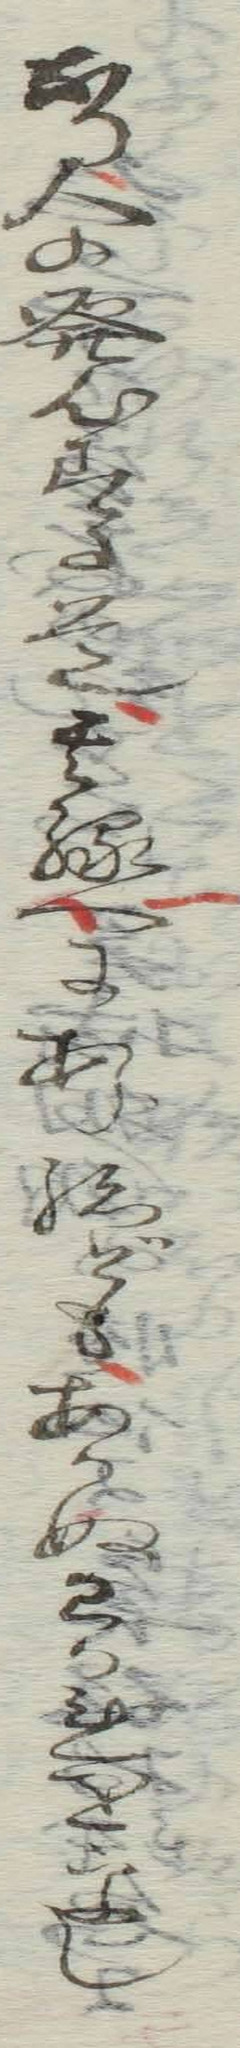なり、人の発心する道、其縁一にあらねども、あかぬわかれををし
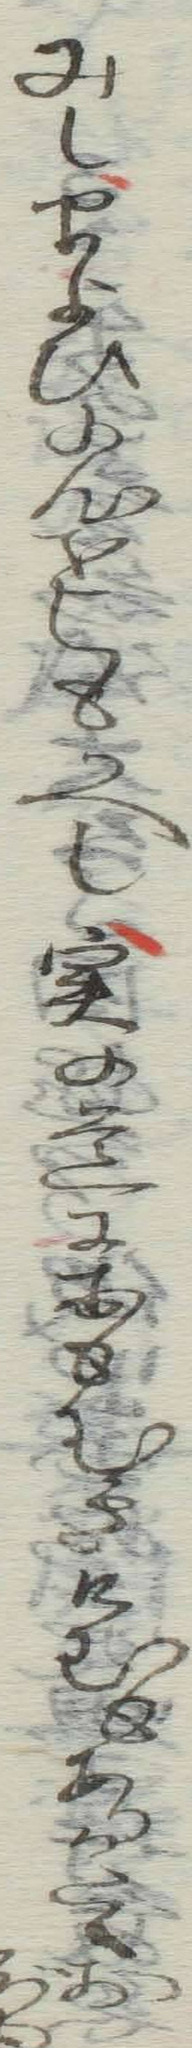みし、まよひの心をしもかへし、実の道におもむきけむもありかたくおぼゆ、
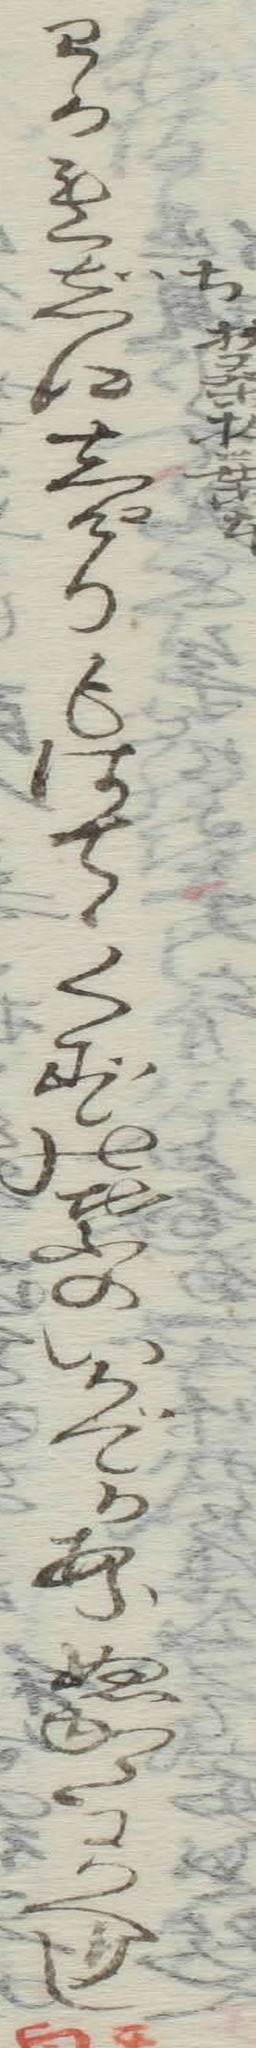わかれじにしげりもはてゝくずの葉のいかでかあらぬかたにかへりしモ白
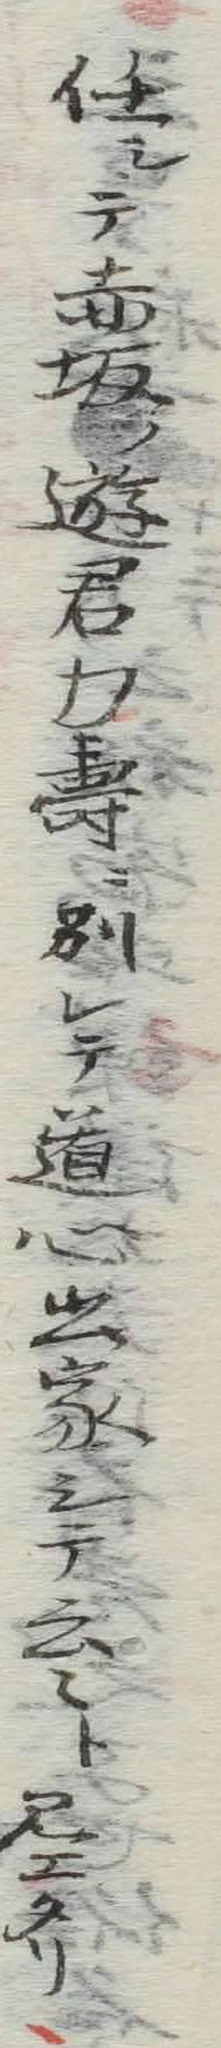任シテ赤坂ノ遊君力壽ニ別レテ道心出家シテ云々ト見エタリ、
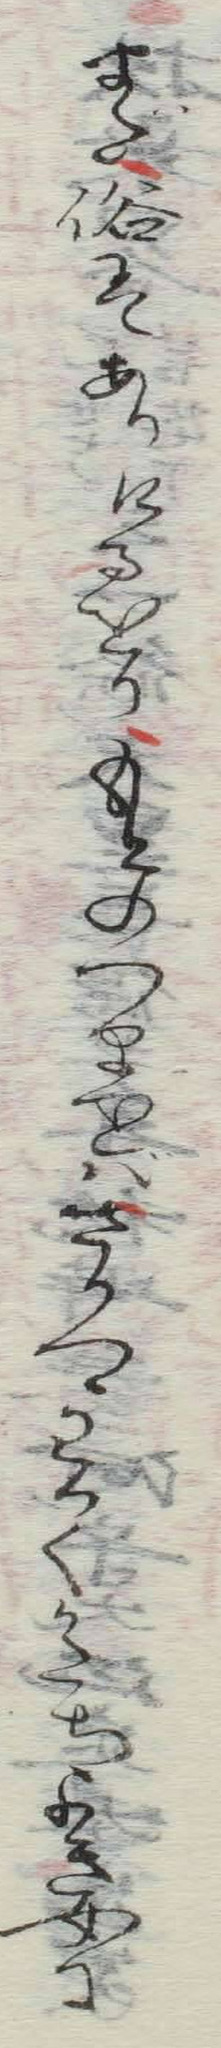まだ、俗にてありけるをり、もとのつまをば、さりつゝわかくかたちよき女に
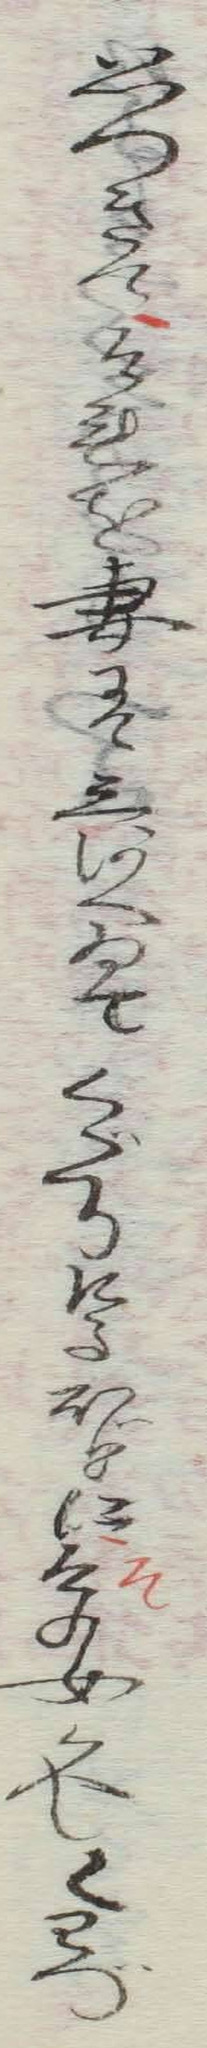思つきて、それを妻にて三河へゐてくだりけるほどに、その女久しくわづ
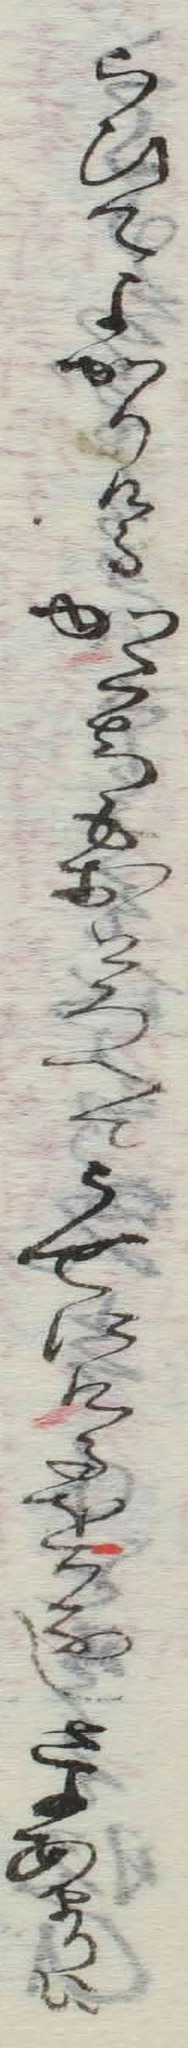らひてよかりけるかたちもおとろへてうせにけるを、かなしさのあまりに
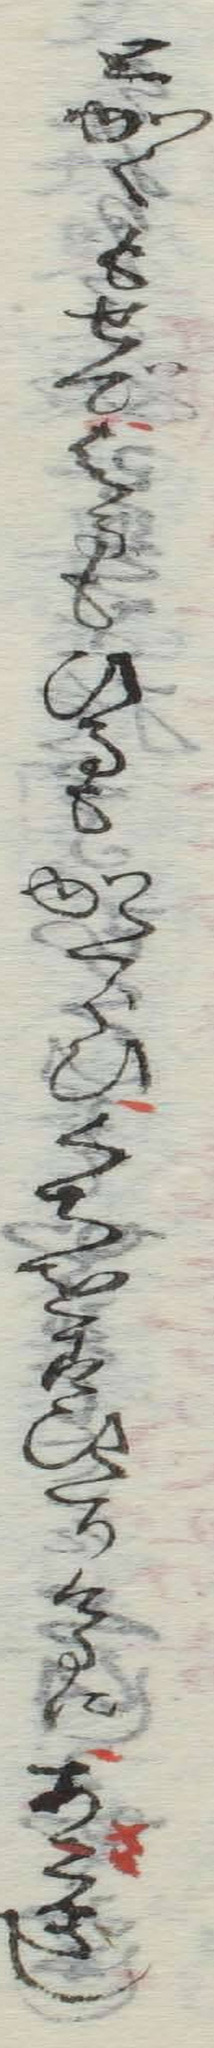とかくもせで、よるもひるもかたらひ、くちをすひたりけるに、あさまし
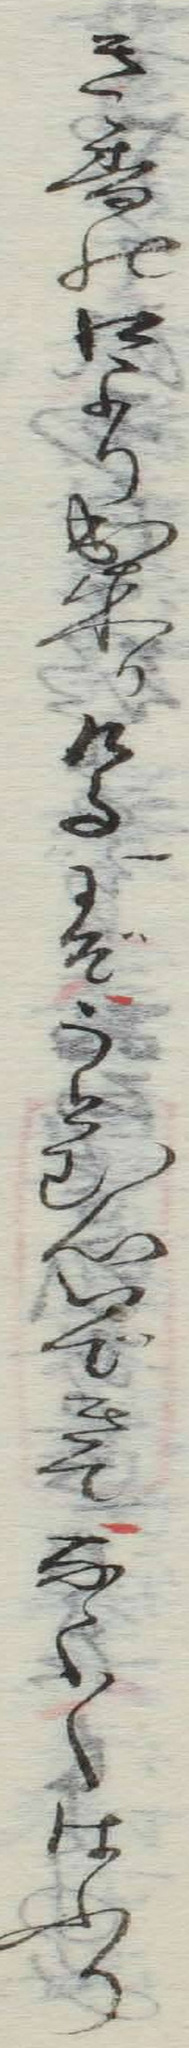き香の口より出来りけるにぞ、うとむ心いできて、なく〳〵はふり
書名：三河国古跡考
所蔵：国文学研究資料館
